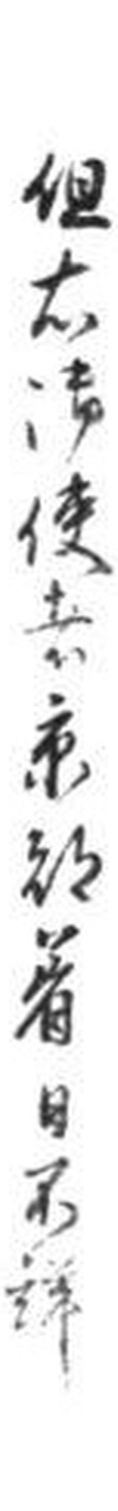但右御使者京都着日不詳
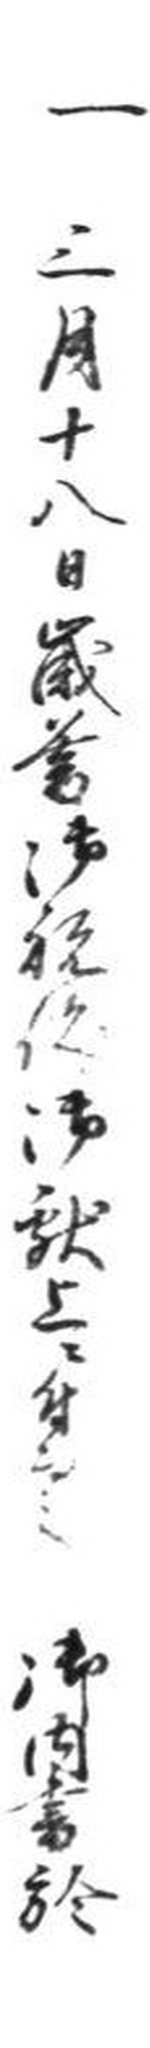一三月十八日歳暮御祝儀御献上ニ付而之御内書於
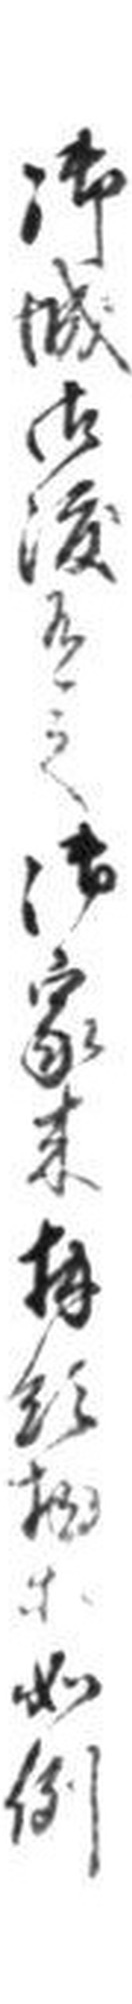御城御渡有之御家来拝領物等如例
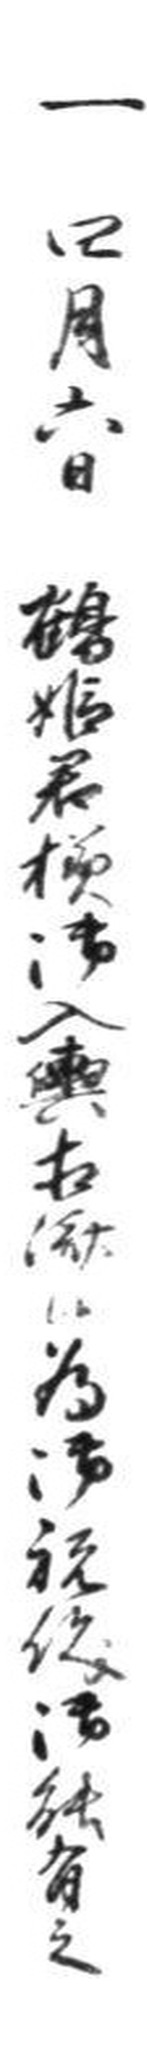一四月六日鶴姫君様御入輿相済候為御祝儀御触有之
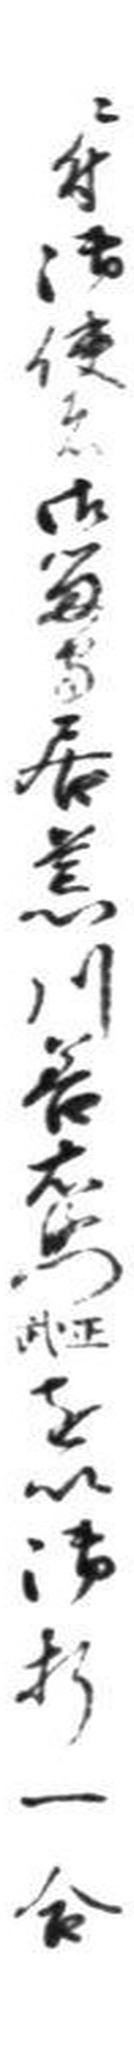ニ付御使者御留守居荒川善右衛門正武を以御折一合
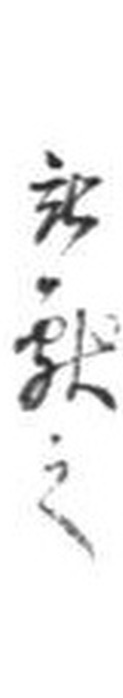被献之
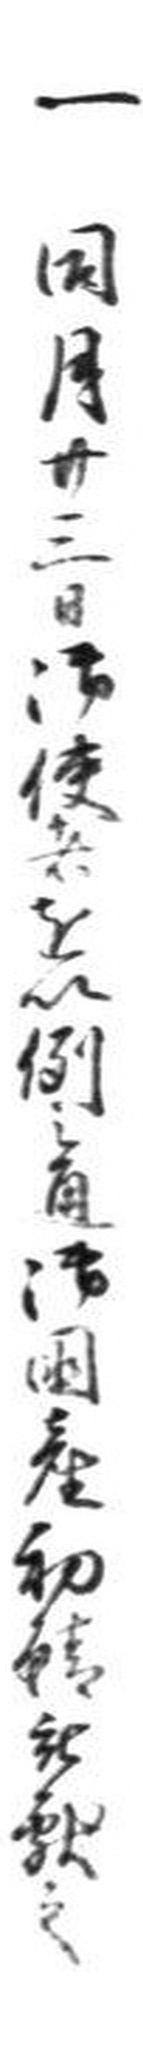一同月廿三日御使者を以例之通御国産初鯖被献之
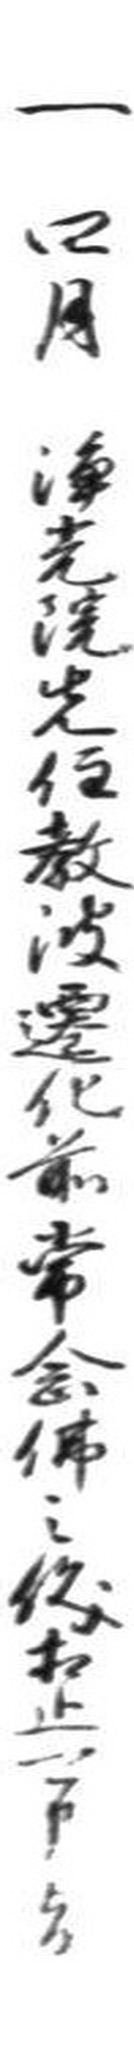一四月浄光院先住教波遷化前常念仏之儀相止可申旨
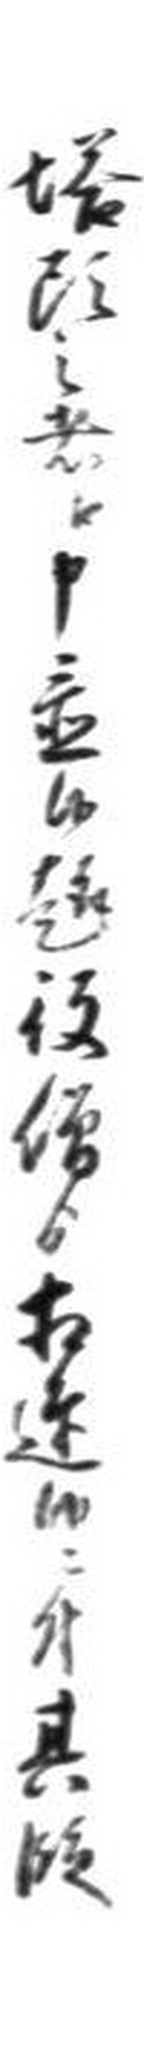塔頭之者江申置候趣役僧ゟ相達候ニ付其段
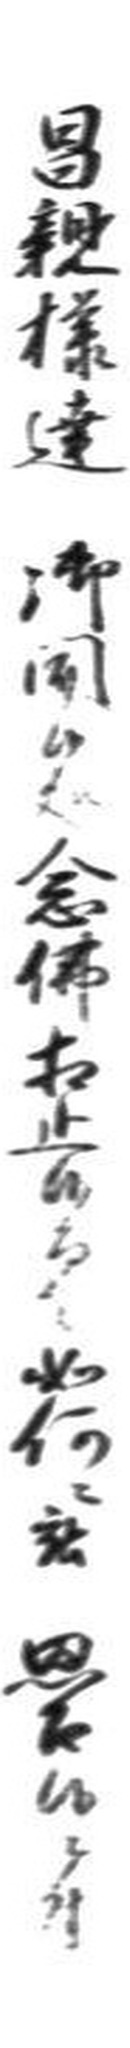昌親様達御聞候処念仏相止候旨と如何ニ被思召候ニ付
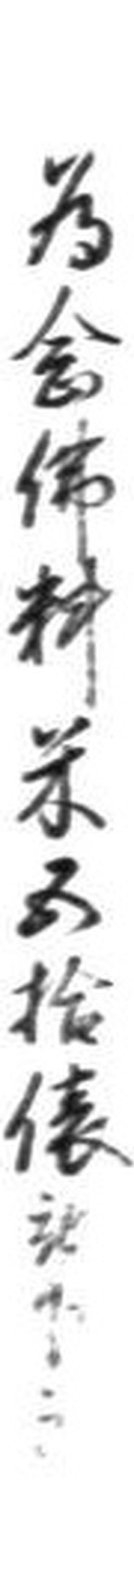為念仏料米五拾俵被下之
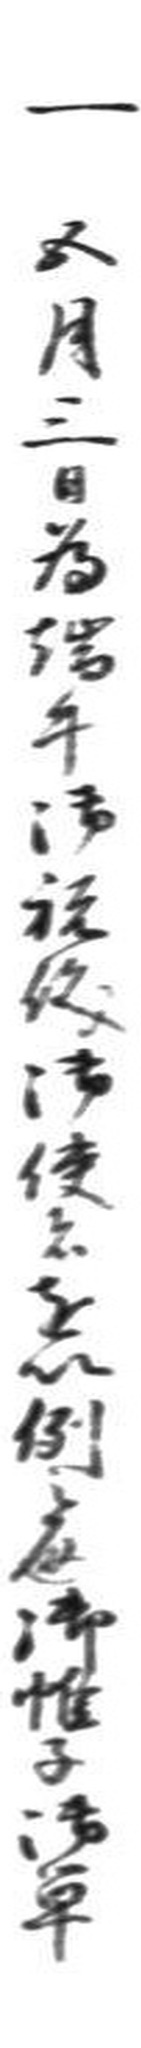一五月三日為端午御祝儀御使者を以例之通御帷子御単
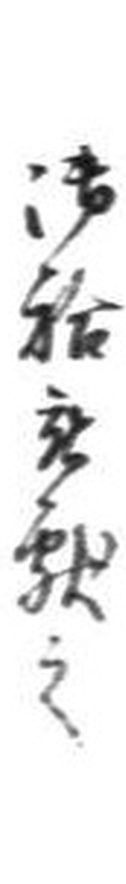御袷被献之
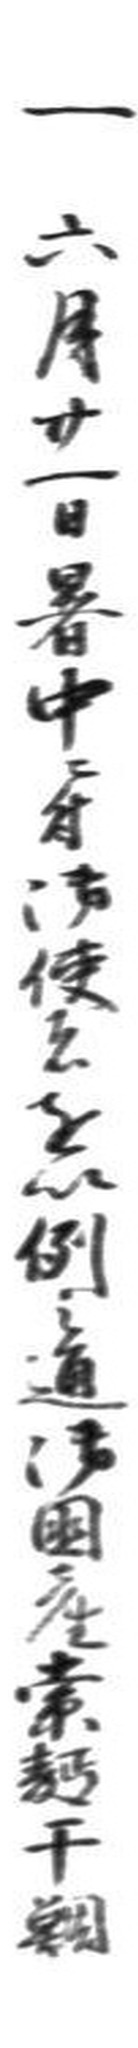一六月廿一日暑中ニ付御使者を以例之通御国産索麪干鯛
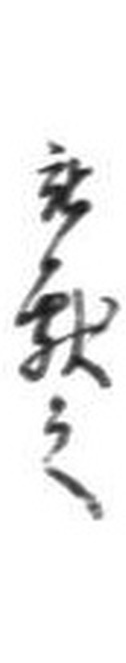被献之
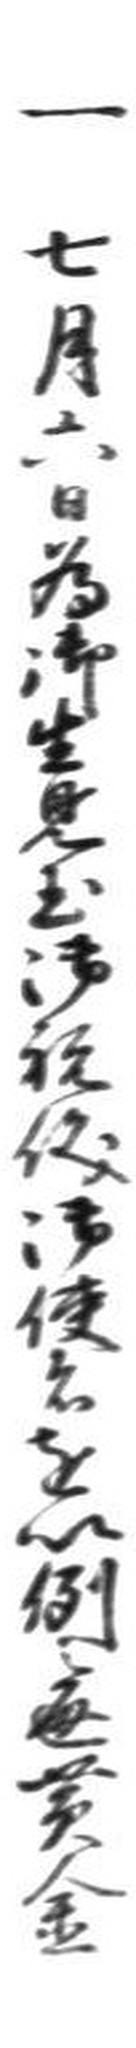一七月六日為御生見玉御祝儀御使者を以例之通黄金
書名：家譜 十五 綱昌公 従天和元年到元禄十二年
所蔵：福井県文書館 Fukui Prefectural Archives
